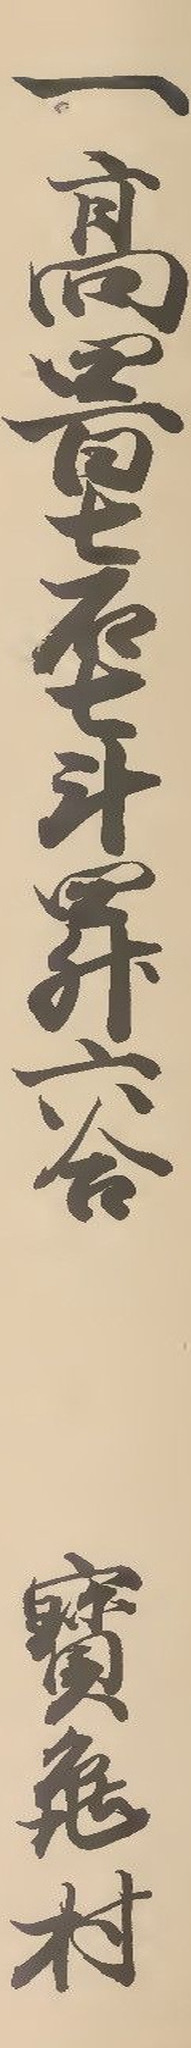一髙四百七石七斗四升六合寶龜村
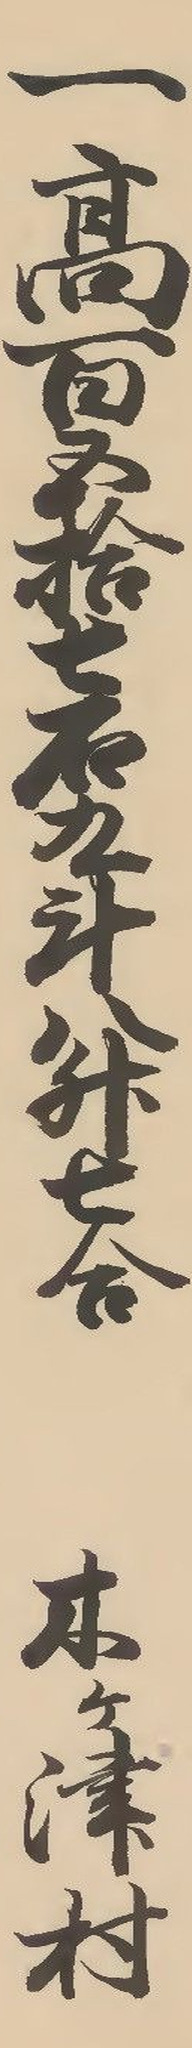一髙百五拾七石九斗八升七合木ケ津村
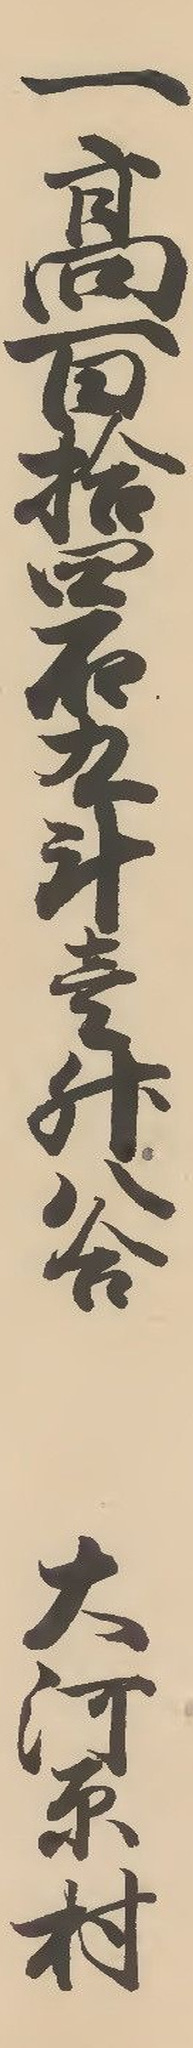一髙百拾四石九斗壱升八合大河原村
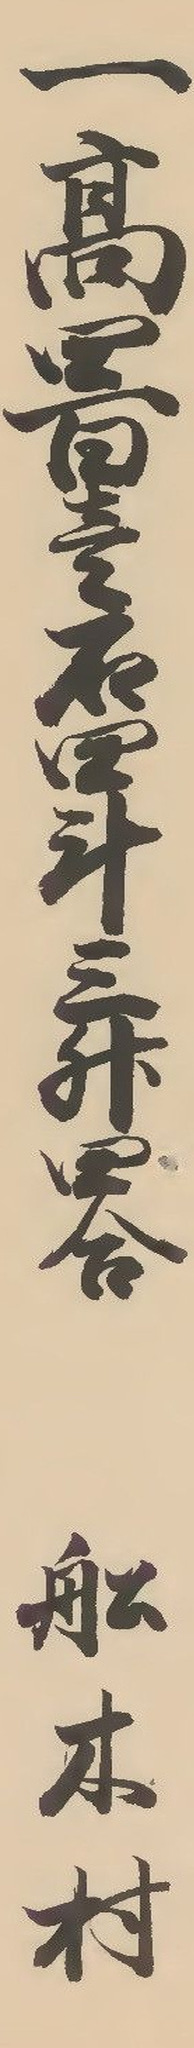一髙四百壱石四斗三升四合舩木村

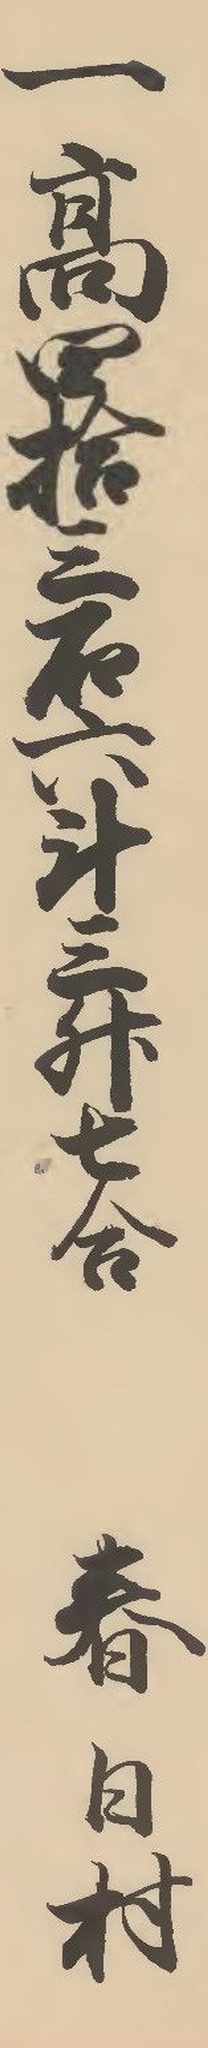一髙四拾三石六斗三升七合春日村
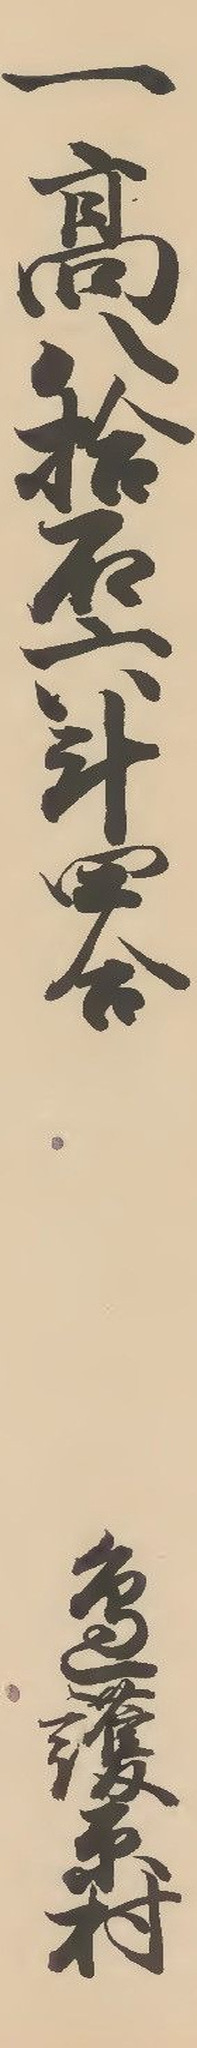一髙八拾石六斗四合邊護原村
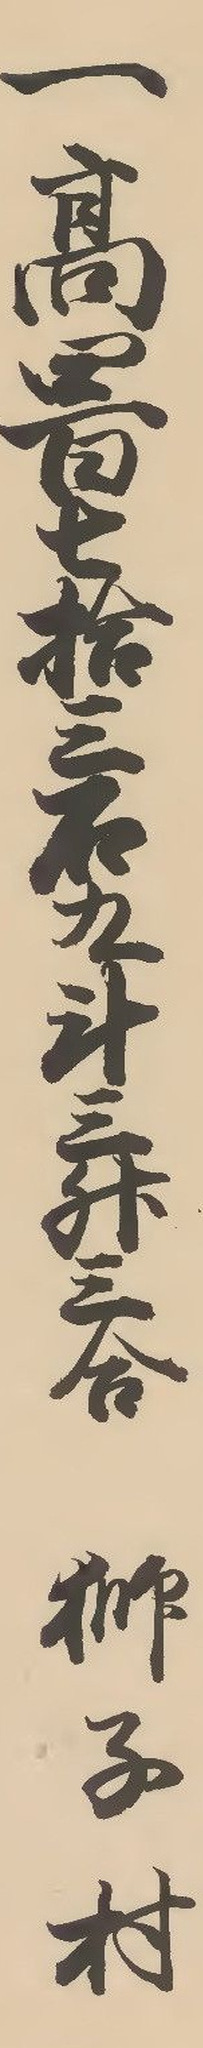一髙四百七拾三石九斗三升三合獅子村
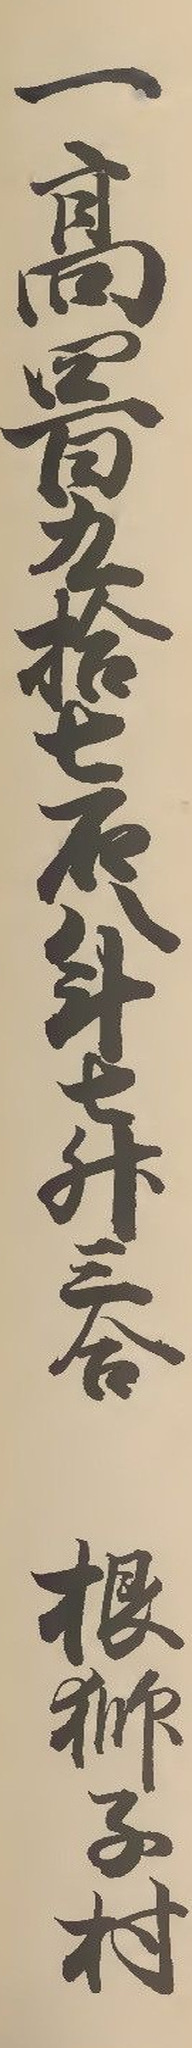一髙四百九拾七石八斗七升三合根獅子村
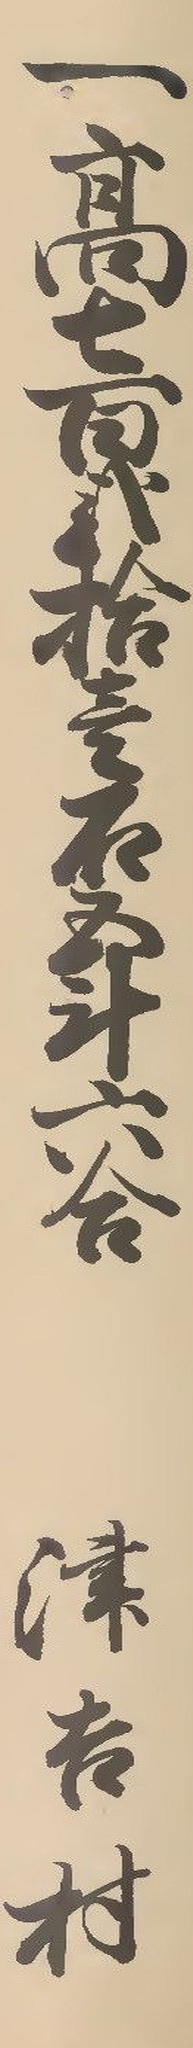一髙七百弐拾壱石五斗六合津吉村
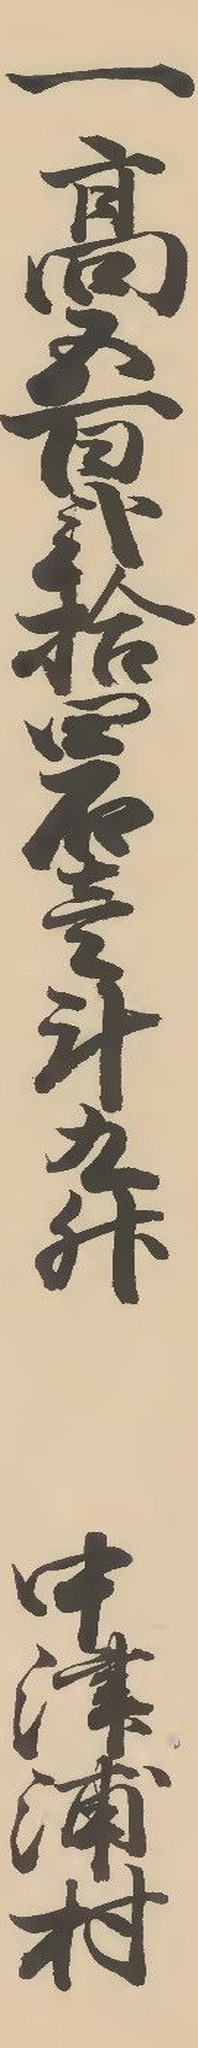一髙五百弐拾四石壱斗九升中津浦村
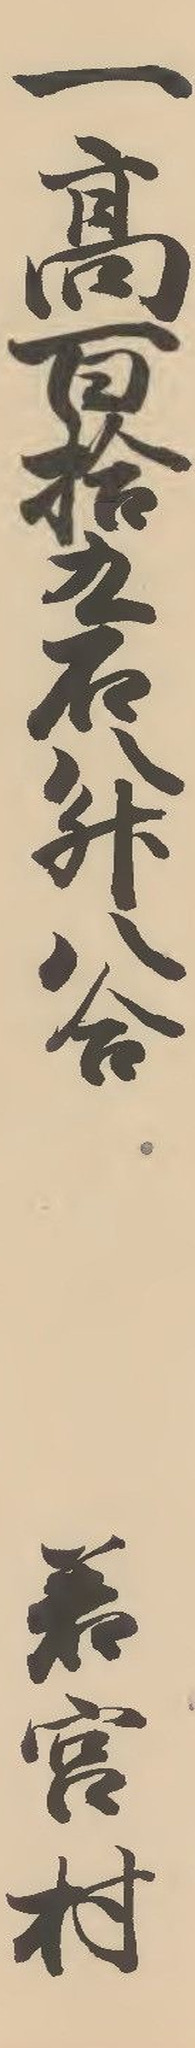一髙百拾九石八升八合若宮村
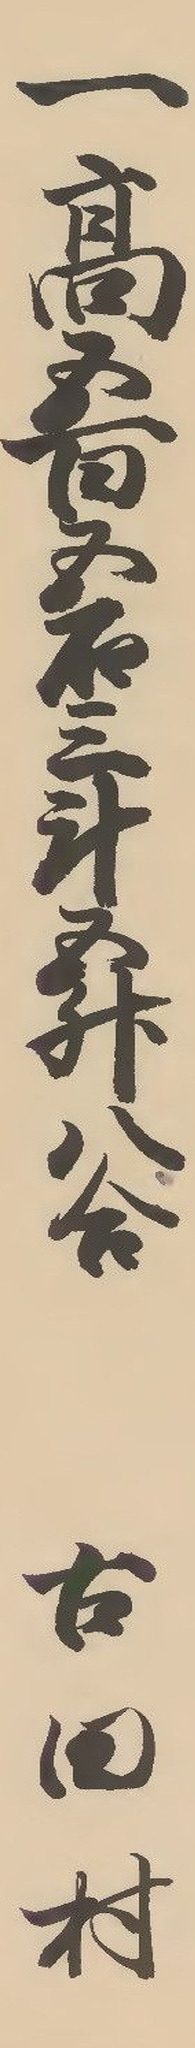一髙五百五石三斗五升八合古田村

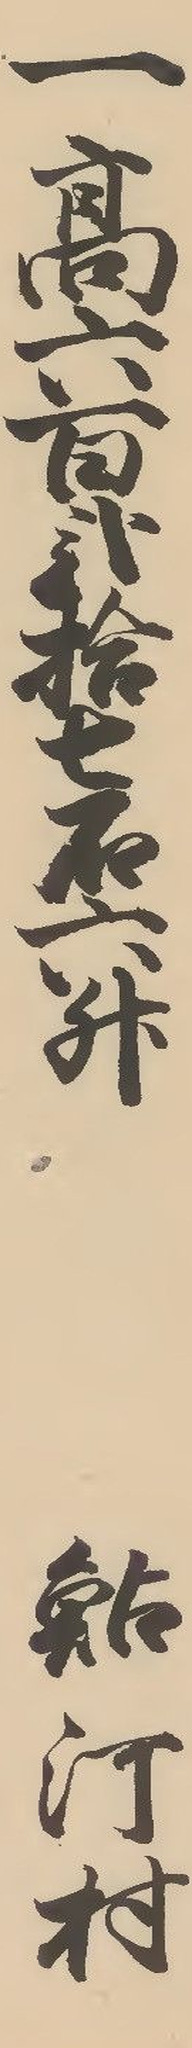一髙六百弐拾七石六升鮎河村
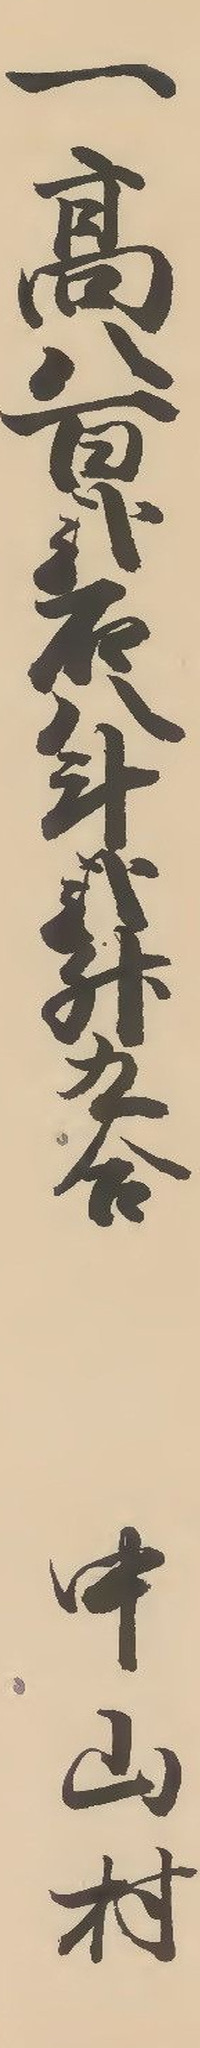一髙八百弐石八斗弐升九合中山村
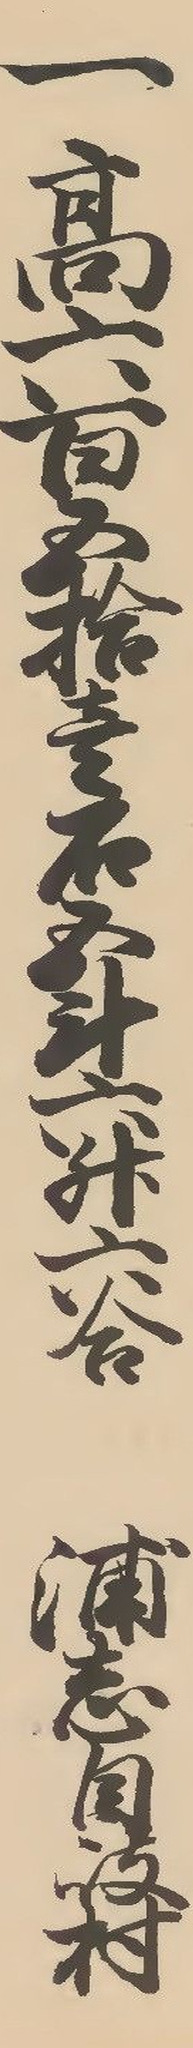一髙六百五拾壱石五斗六升六合浦志目岐村
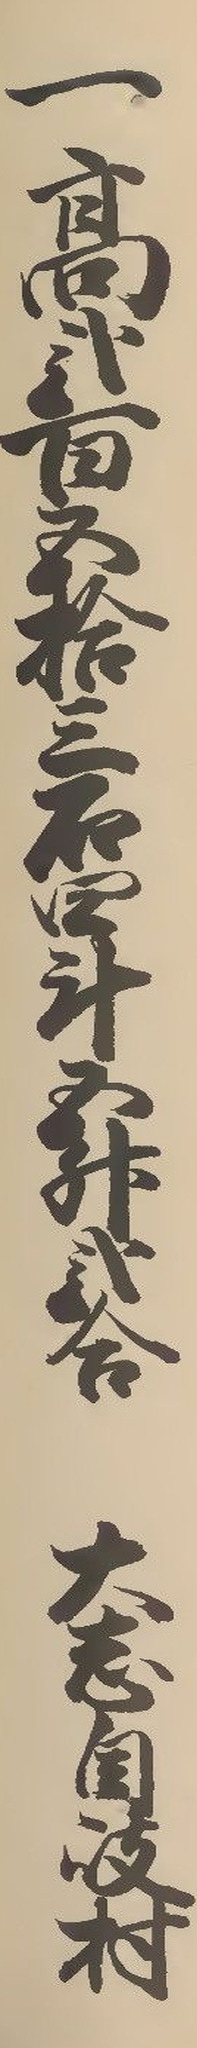一髙弐百五拾三石四斗五升弐合大志目岐村
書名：肥前国郷帳
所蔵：国立公文書館 National Archives of Japan
